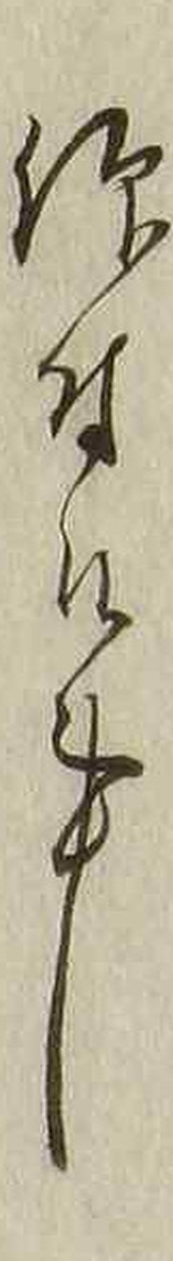仰付候事
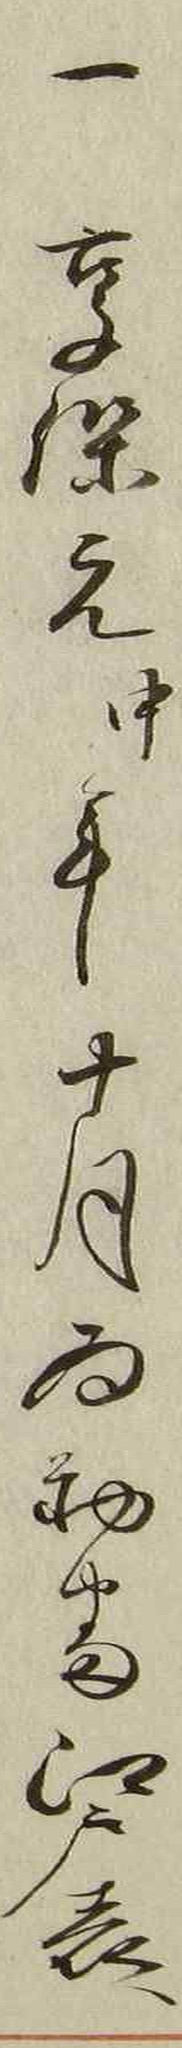一享保元申年十月為勤番江戸表へ
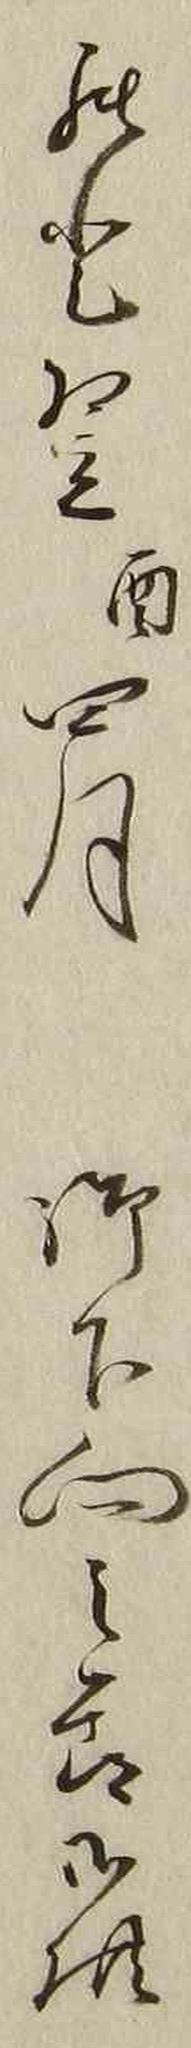罷登翌酉年四月御下向之節御供
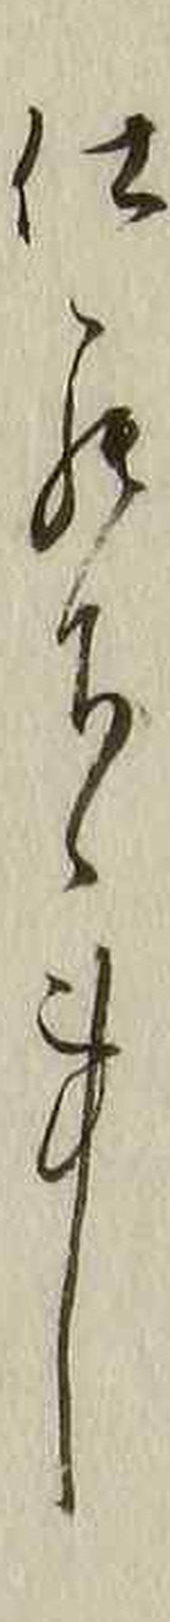仕罷下候事
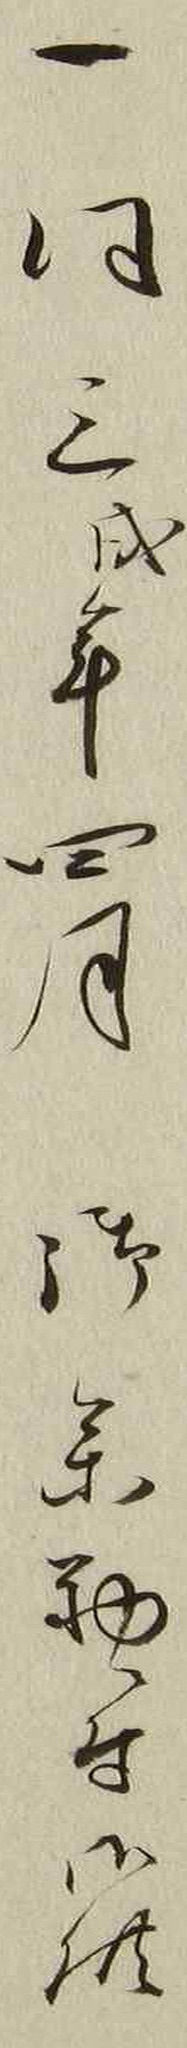一同三戌年四月御参勤ニ付御供
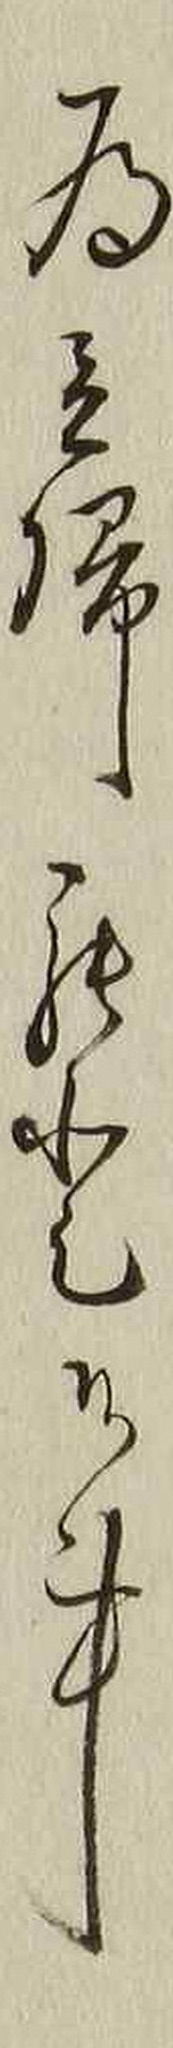為立帰罷登候事
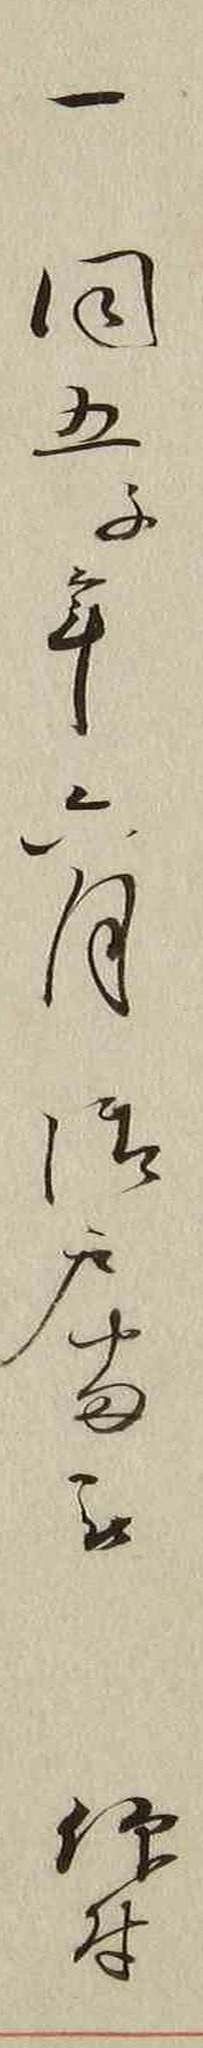一同五子年六月御戸番被仰付
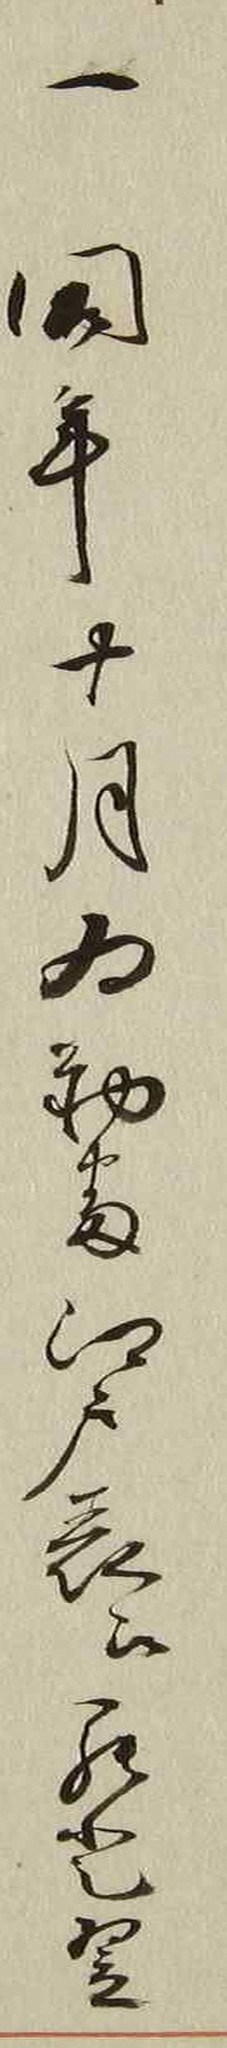一同年十月為勤番江戸表江罷登翌
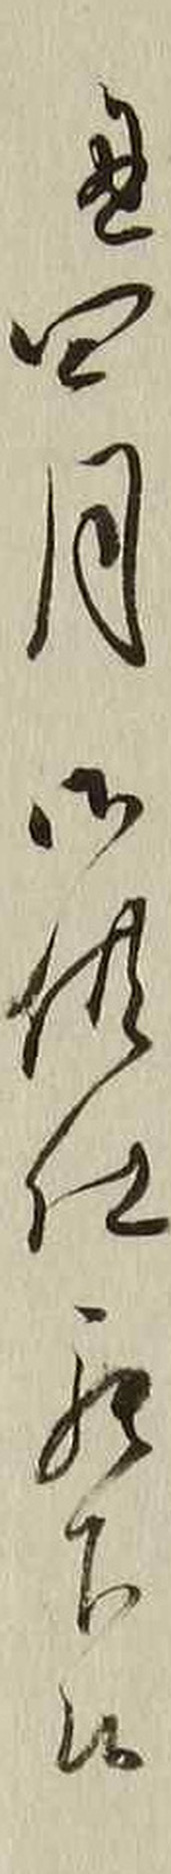丑四月御供仕罷下候
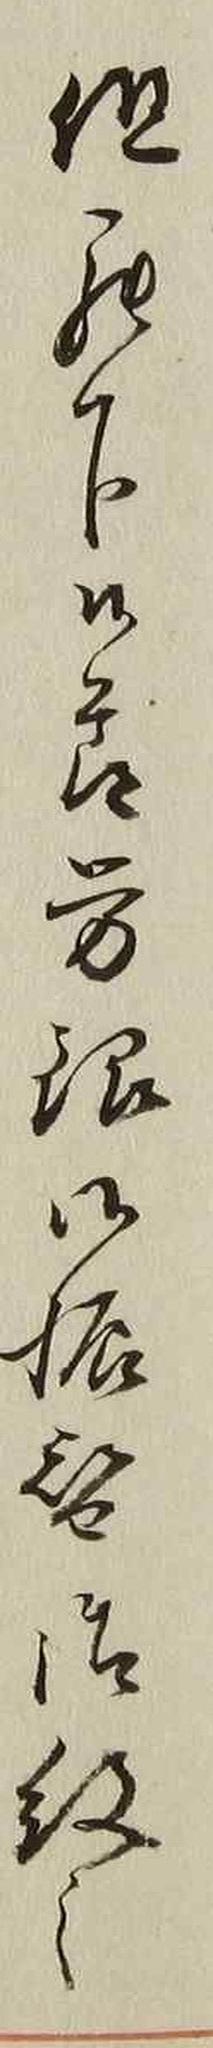但罷下候節労銀御振替御紋之
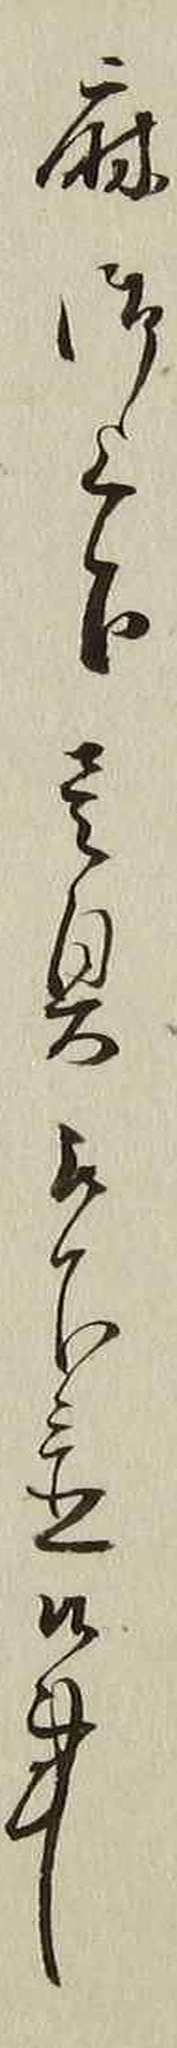麻上下壱具被下置候事
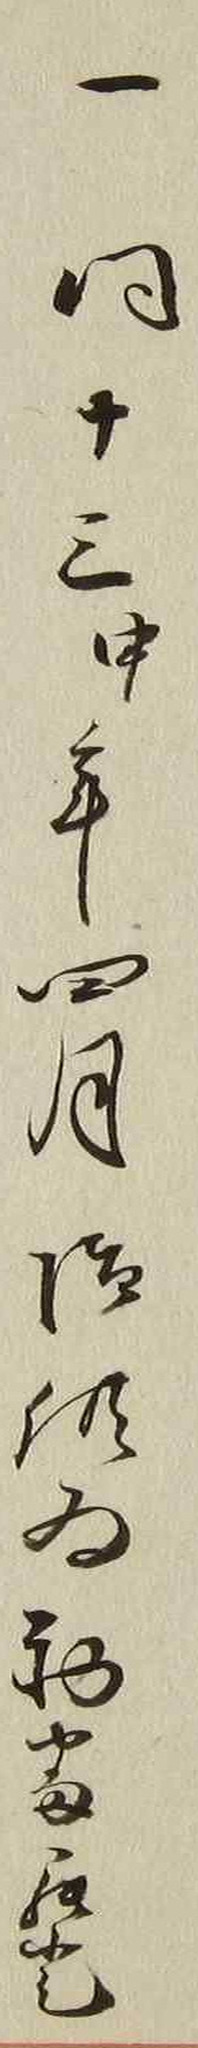一同十三申年四月御供為勤番罷登
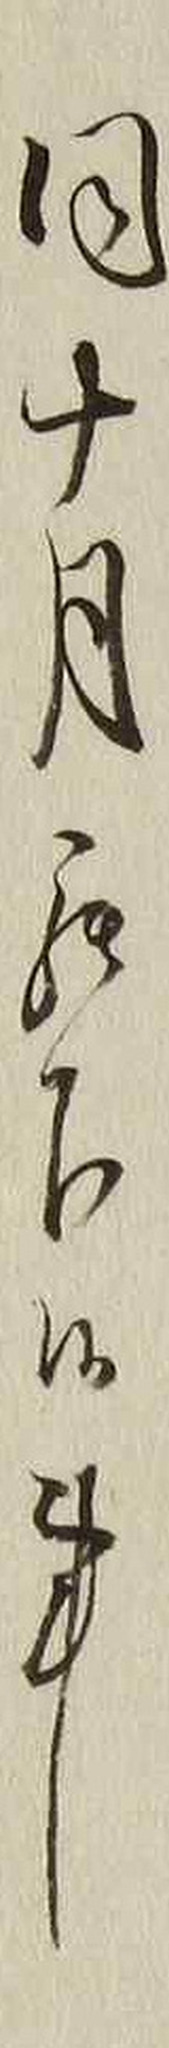同十月罷下候事
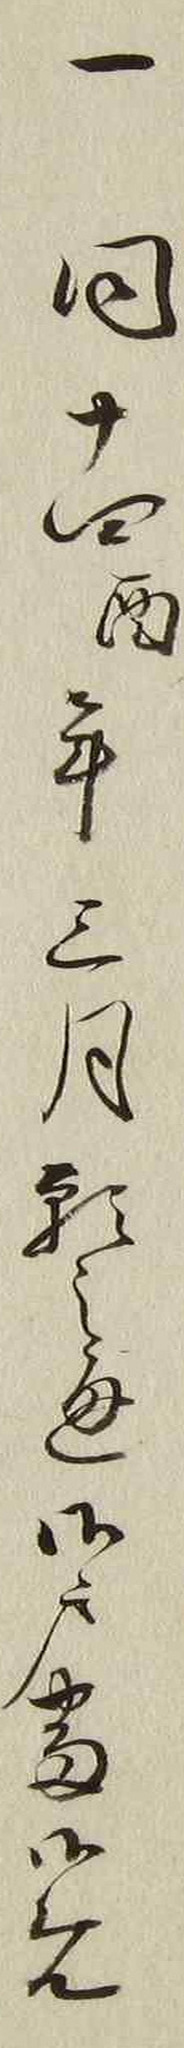一同十四酉年三月親願之通御戸番御免
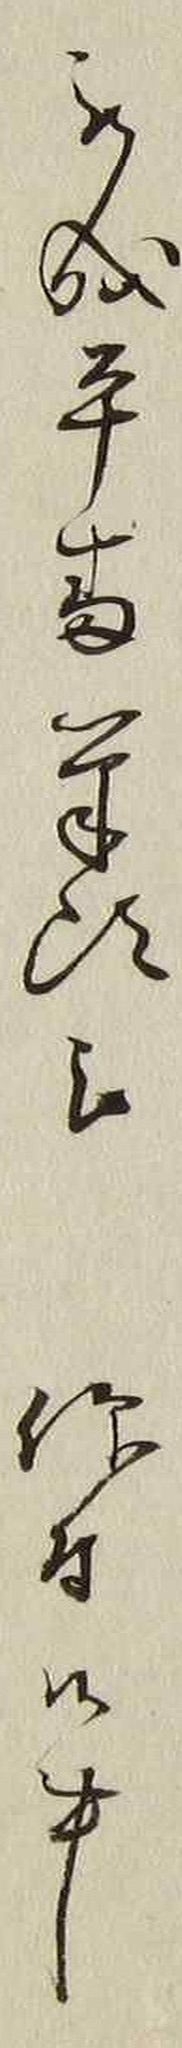被成平番筆頭被仰付候事
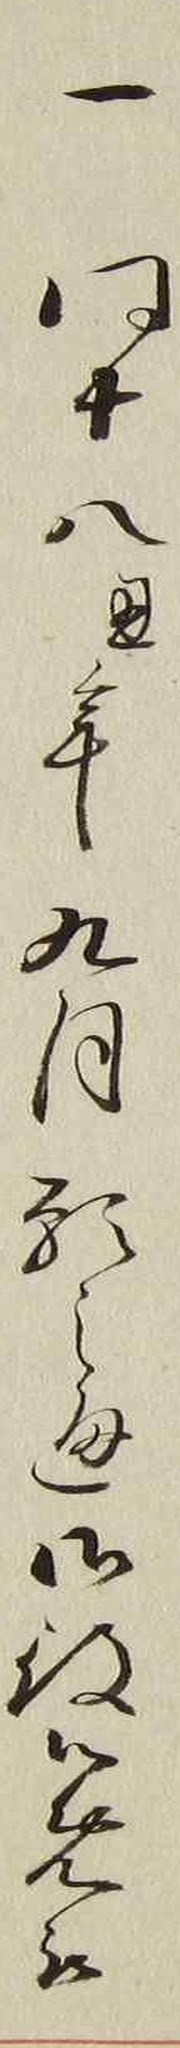一同十八丑年九月願之通御役御免被
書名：諸士系譜　巻之26　い之部26
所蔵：会津若松市立会津図書館
